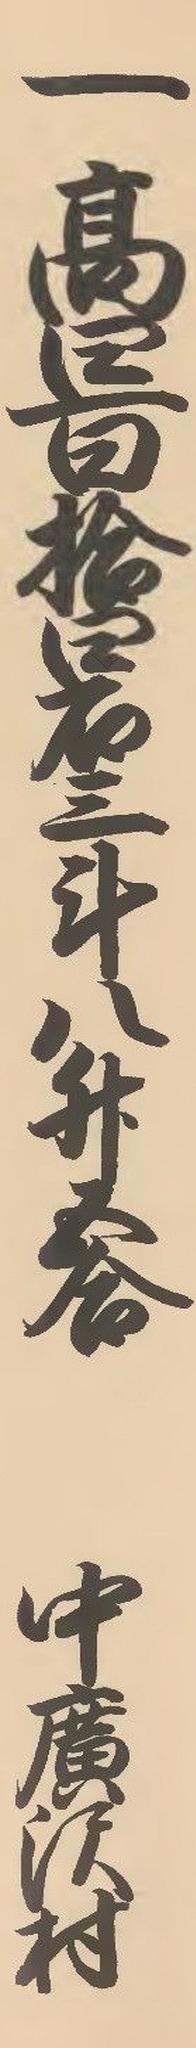一髙四百拾四石三斗八升五合中廣沢村
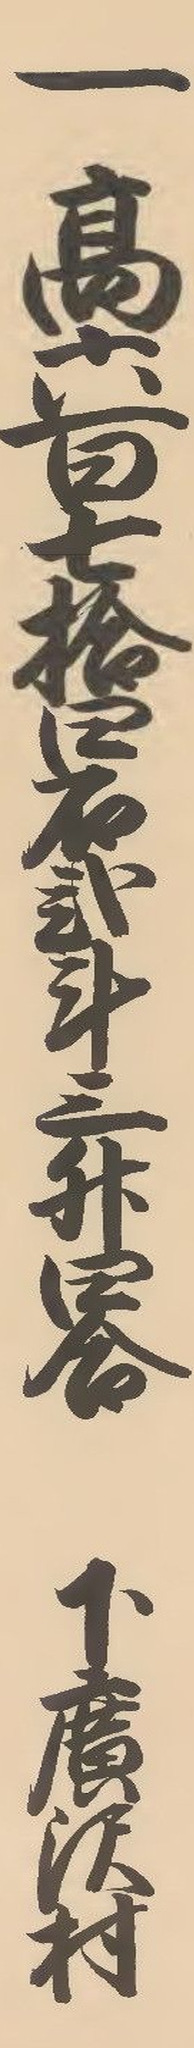一髙六百七拾四石弐斗三升四合下廣沢村
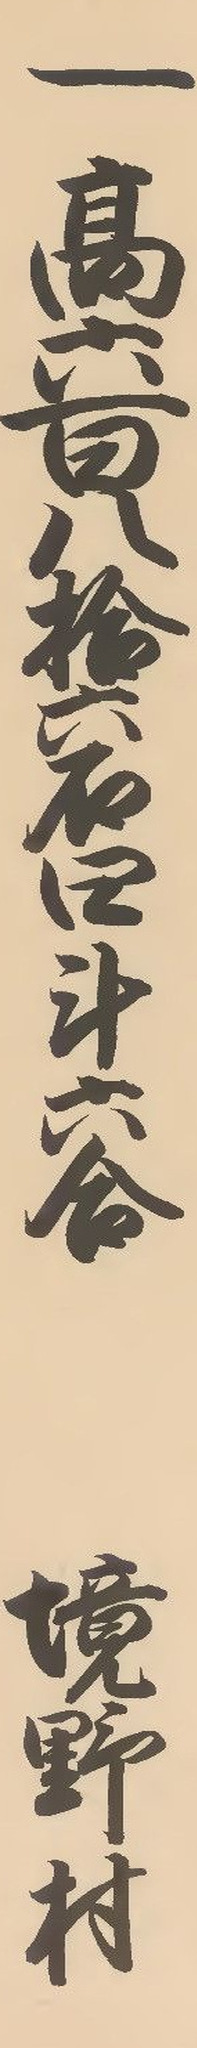一髙六百八拾六石四斗六合境野村

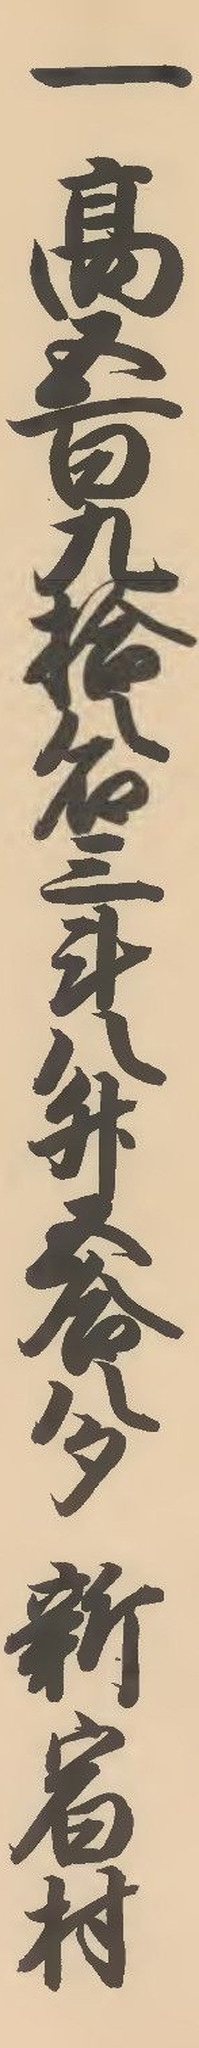一髙五百九拾八石三斗八升五合八夕新宿村
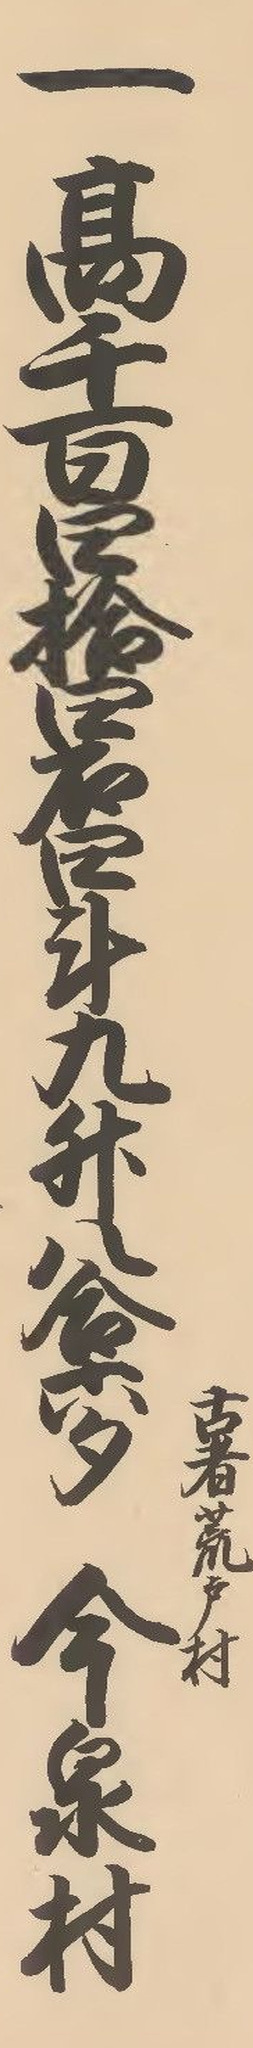一髙千百四拾四石四斗九升八合六夕今泉村
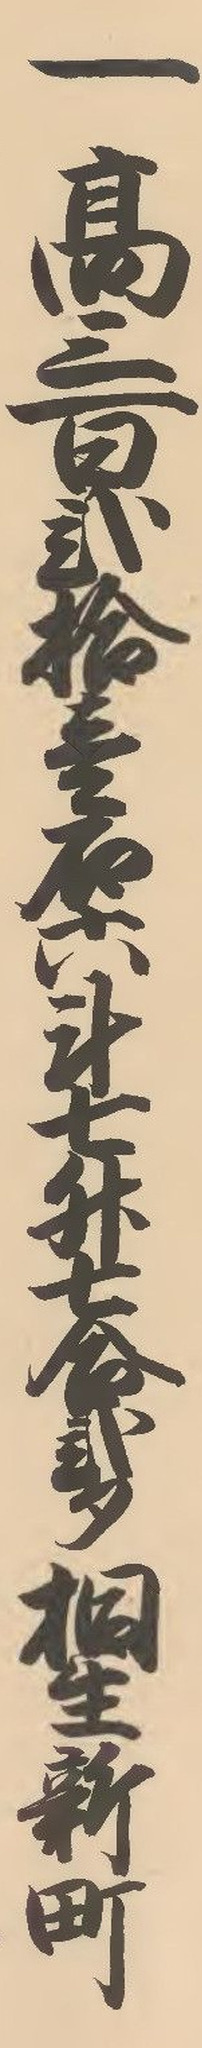一髙三百弐拾壱石六斗七升七合弐夕桐生新町
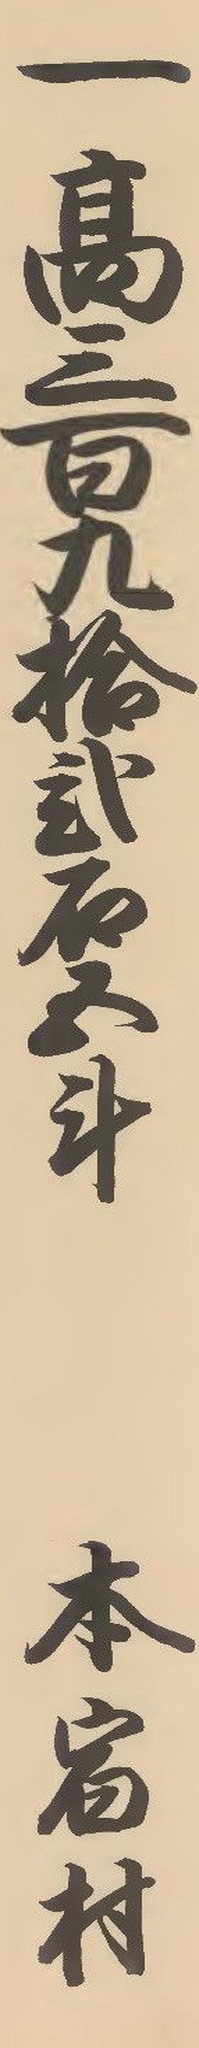一髙三百九拾弐石五斗本宿村
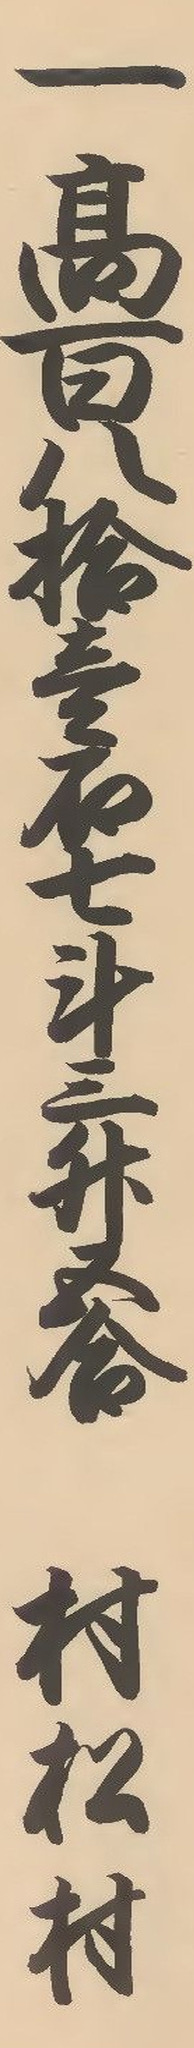一髙百八拾壱石七斗三升五合村松村
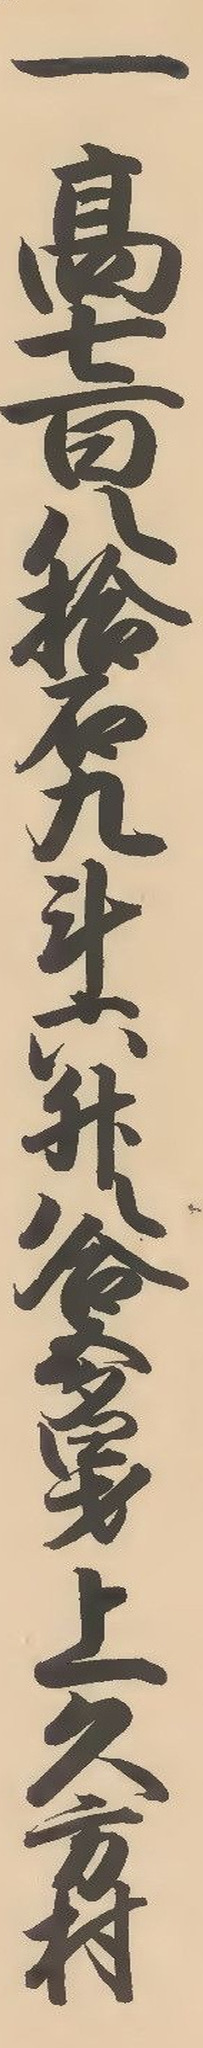一髙七百八拾石九斗六升八合五夕四才
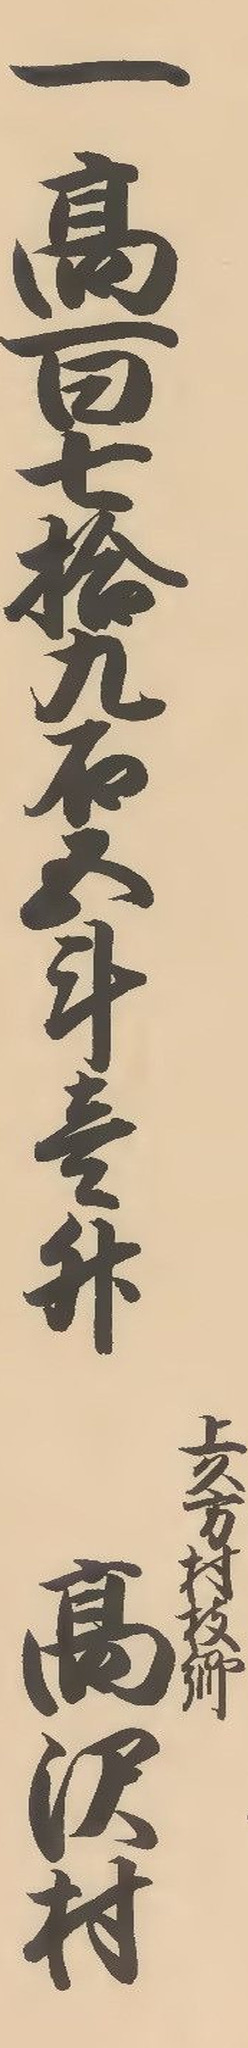一髙百七拾九石五斗壱升髙沢村

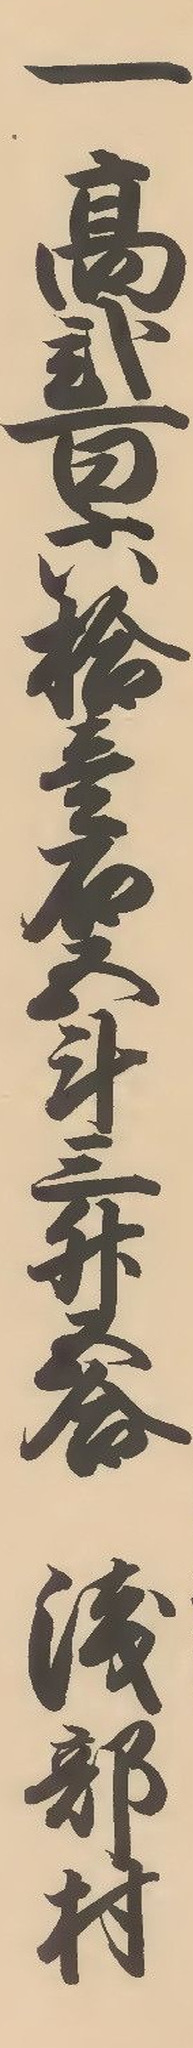一髙弐百六拾壱石五斗三升五合浅部村
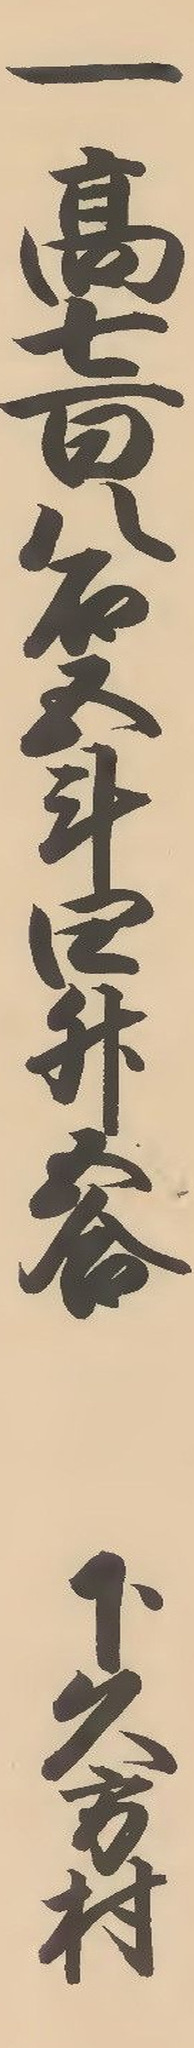一髙七百八石五斗四升五合下久方村
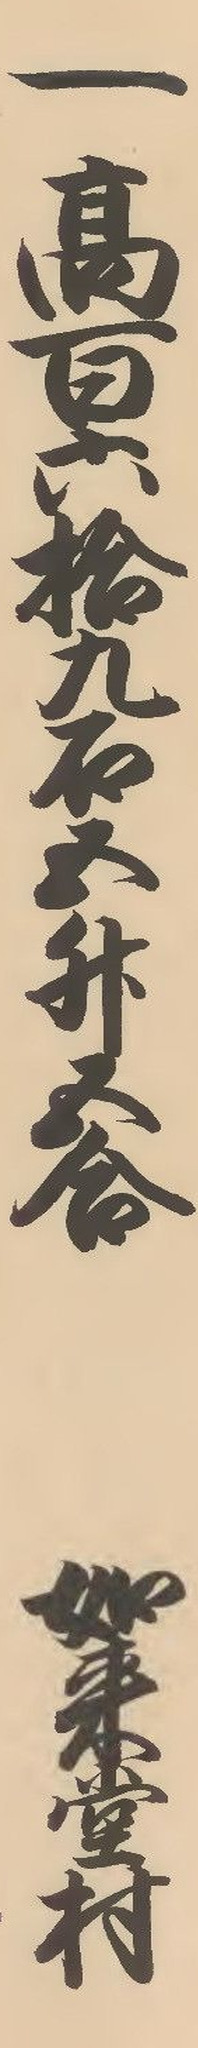一髙百六拾九石五升五合如来堂村
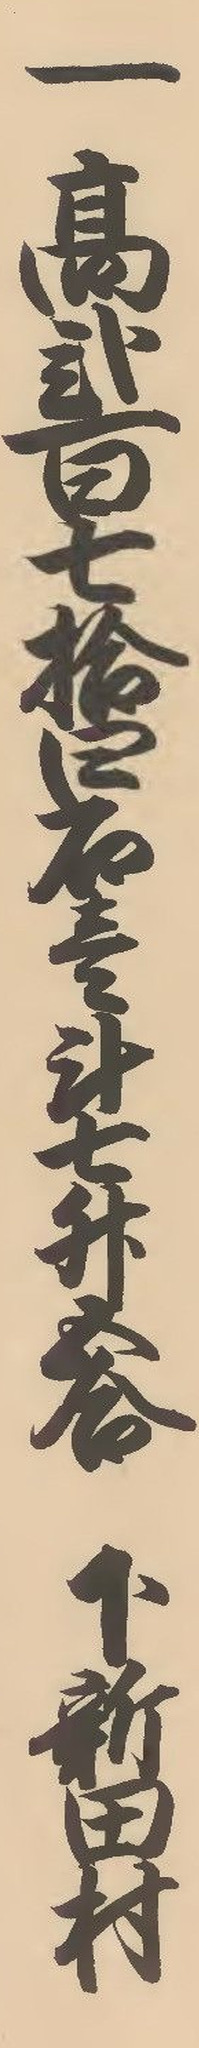一髙弐百七拾四石壱斗七升五合下新田村
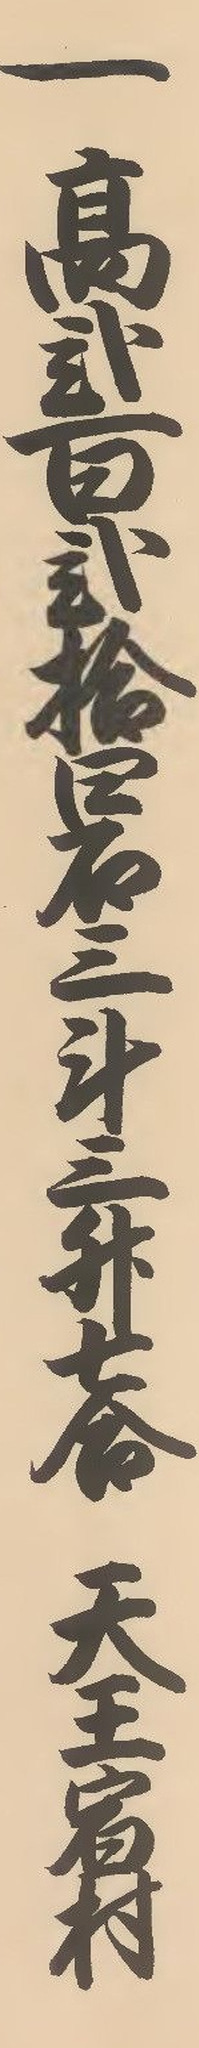一髙弐百弐拾四石三斗三升七合天王宿村
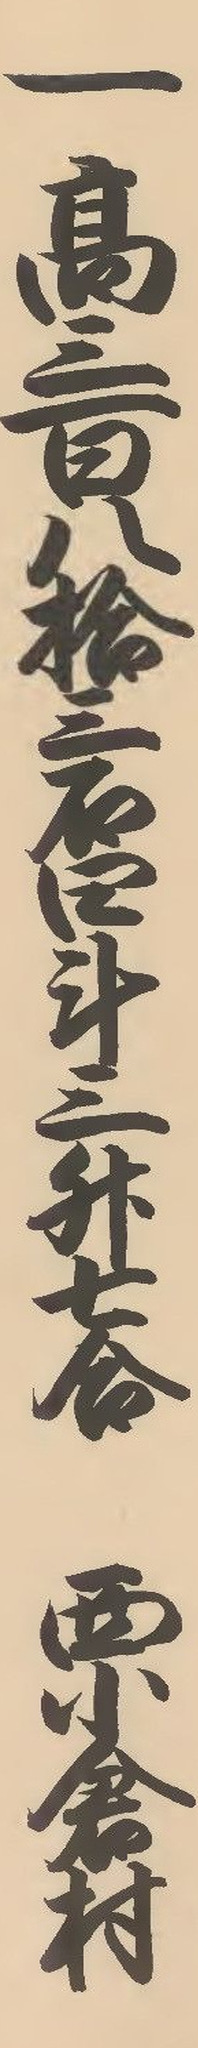一髙三百八拾三石四斗三升七合西小倉村
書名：上野国郷帳
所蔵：国立公文書館 National Archives of Japan
